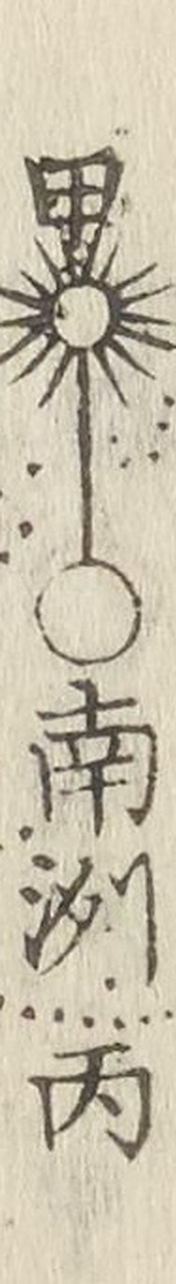甲南洲丙
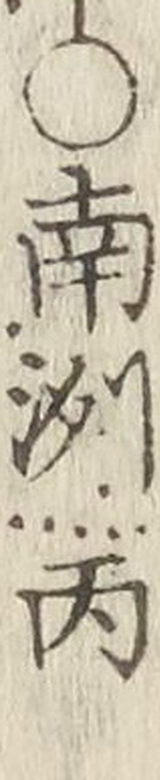甲南洲丙

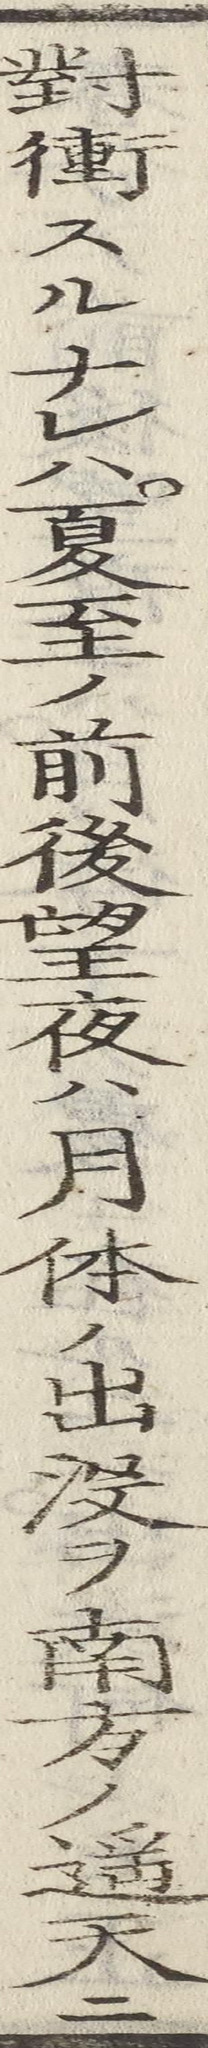対衝スルナレハ。夏至ノ前後望夜ハ月体ノ出没ヲ南方ノ遥天ニ
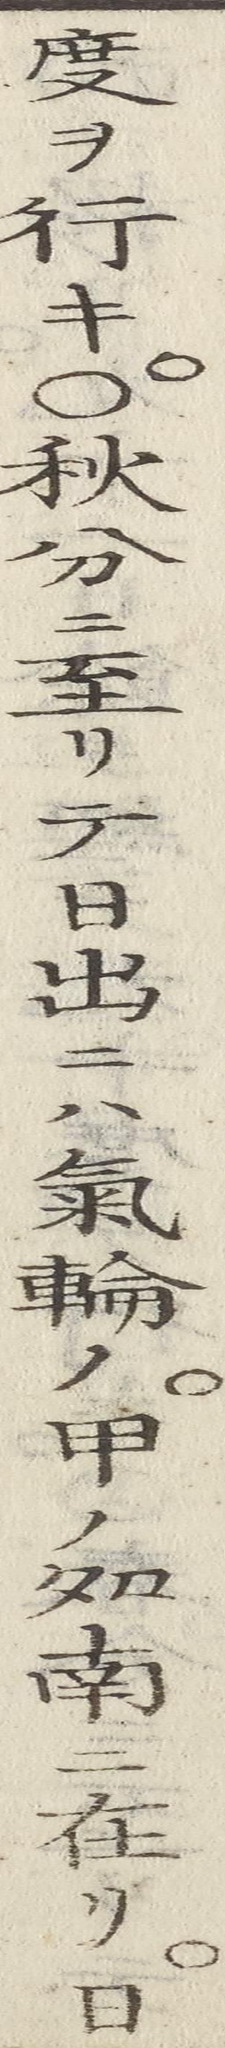度ヲ行キ。〇秋分ニ至リテ日出ニハ気輪ノ。甲ノ処南ニ在リ。日
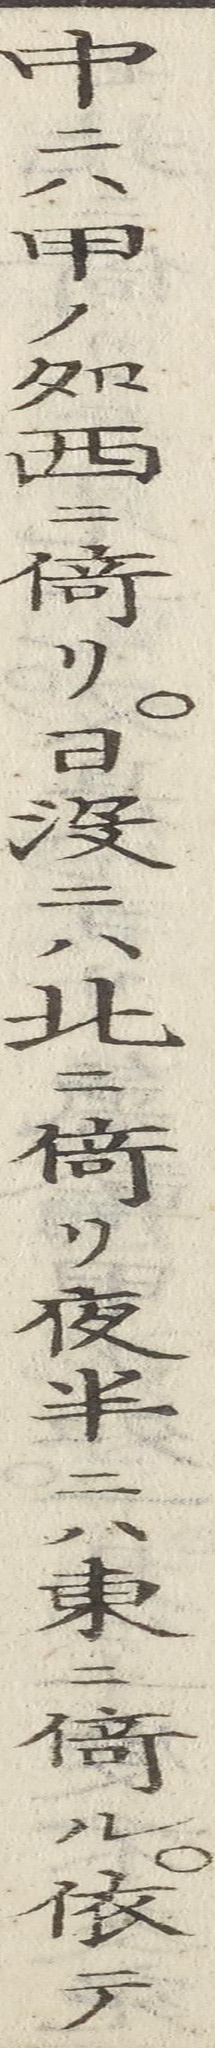中ニハ甲ノ処西ニ倚リ。日没ニハ北ニ倚リ夜半ニハ東ニ倚ル。依テ
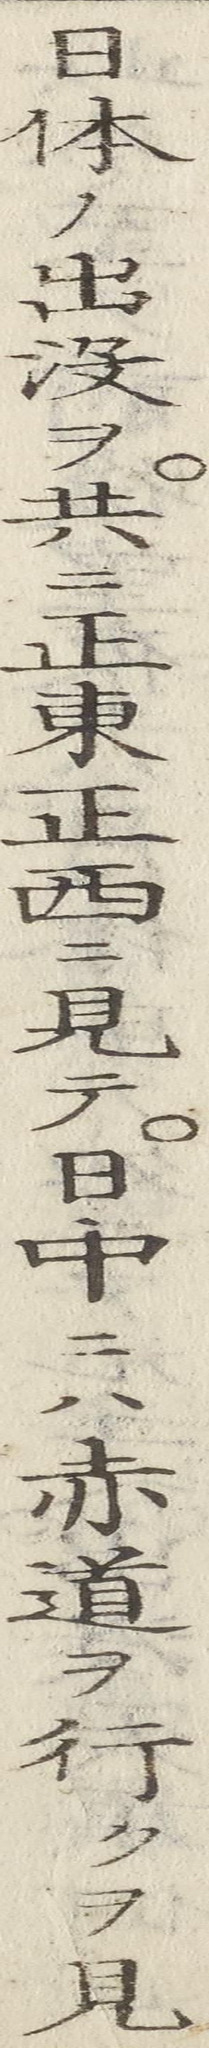日体ノ出没ヲ。共ニ正東正西ニ見テ。日中ニハ赤道ヲ行クヲ見
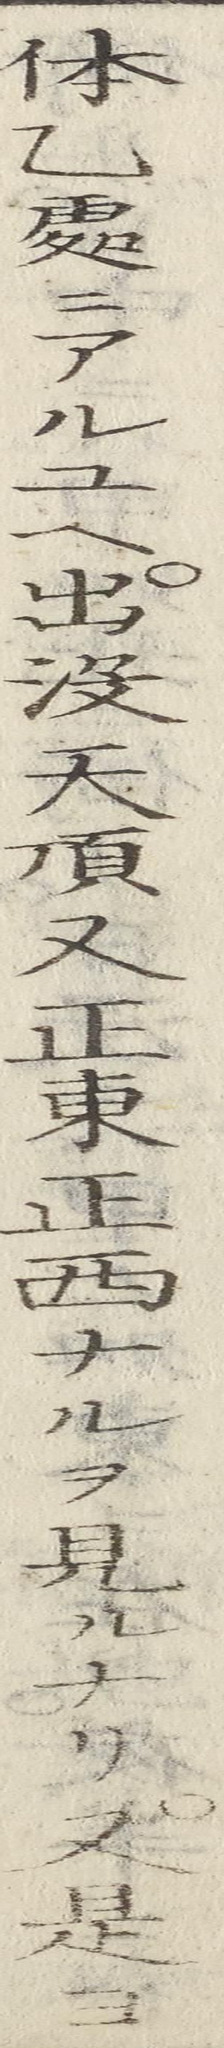体乙処ニアルユヘ。出没天頂又正東正西ナルヲ見ルナリ。又是ヨ
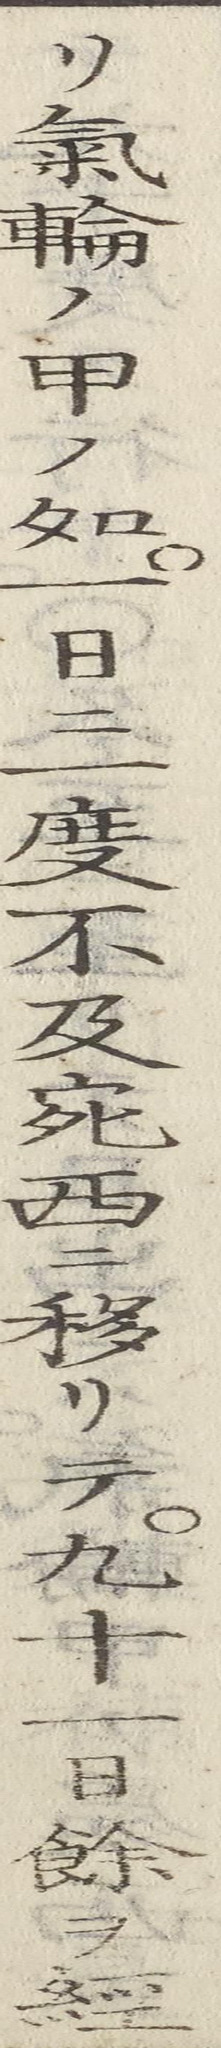リ気輪ノ甲ノ処。一日ニ一度不及宛西ニ移リテ。九十一日余ヲ経

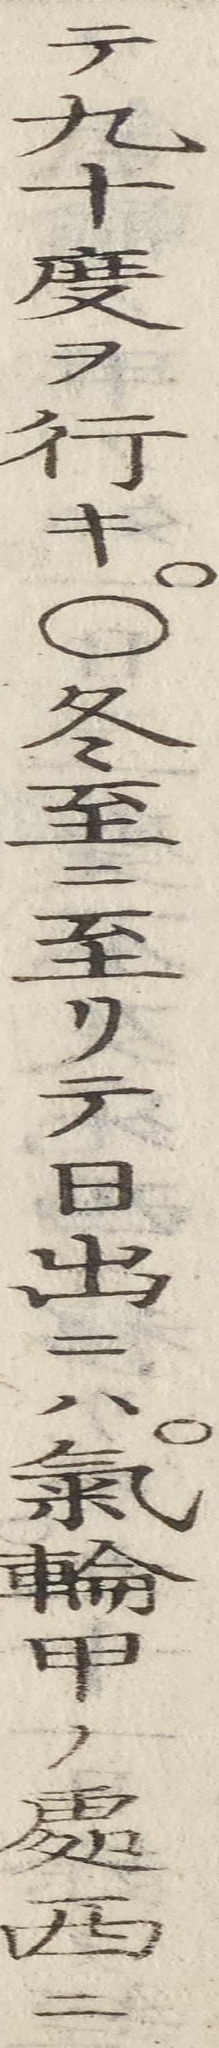テ九十度ヲ行キ。〇冬至ニ至リテ日出ニハ。気輪甲ノ処西ニ
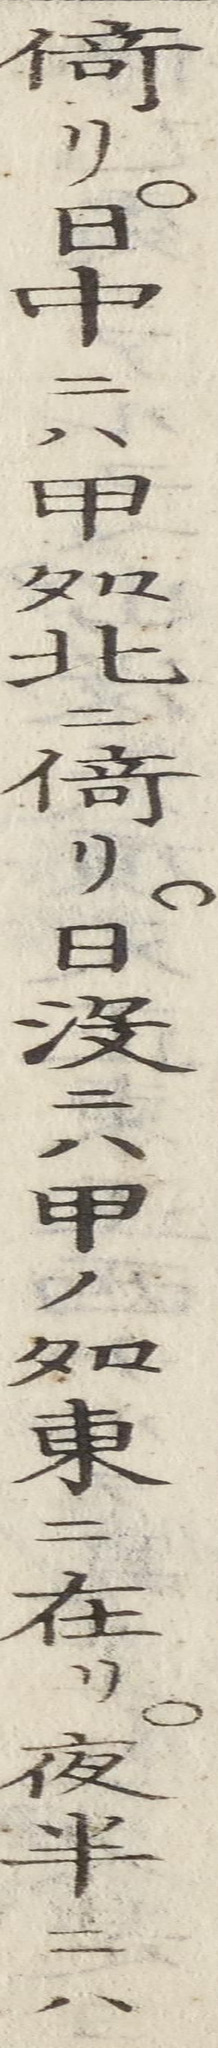倚リ。日中ニハ甲処北ニ倚リ。日没ニハ甲ノ処東ニ在リ。夜半ニハ
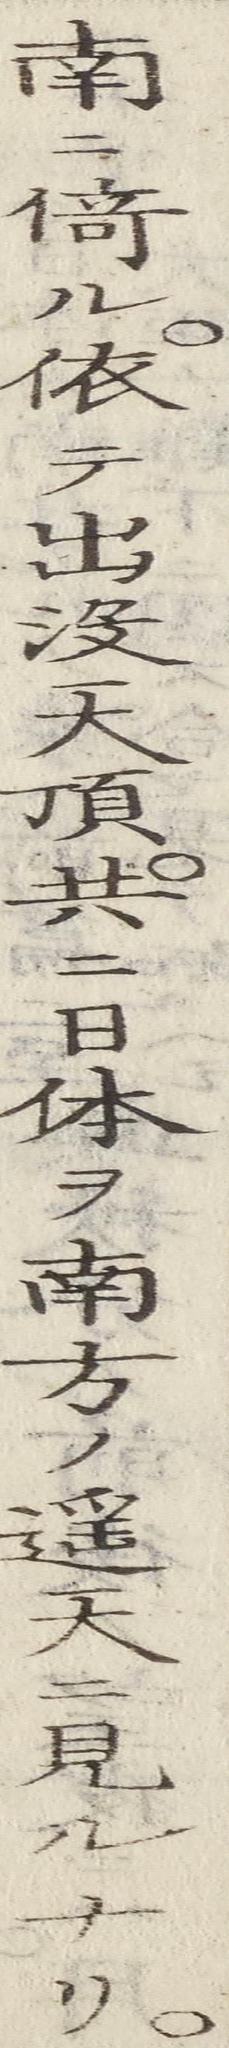南ニ倚ル。依テ出没天頂。共ニ日体ヲ南方ノ遥天ニ見ルナリ。
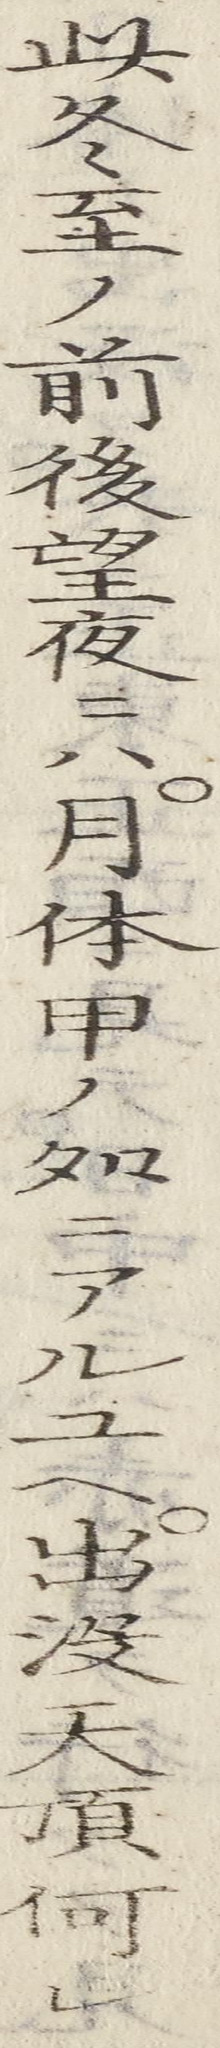此冬至ノ前後望夜ニハ。月体甲ノ処ニアルユヘ。出没天頂何レ
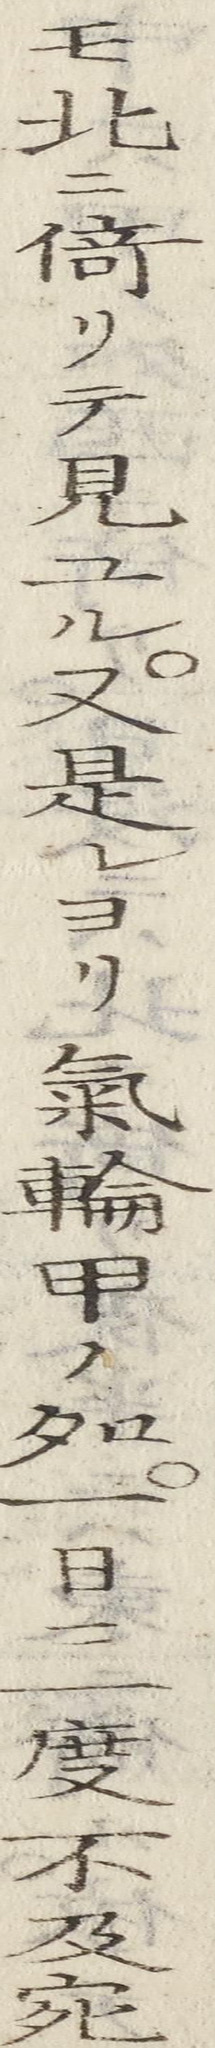モ北ニ倚リテ見ユル。又是レヨリ気輪甲ノ処。一日ニ一度不及宛
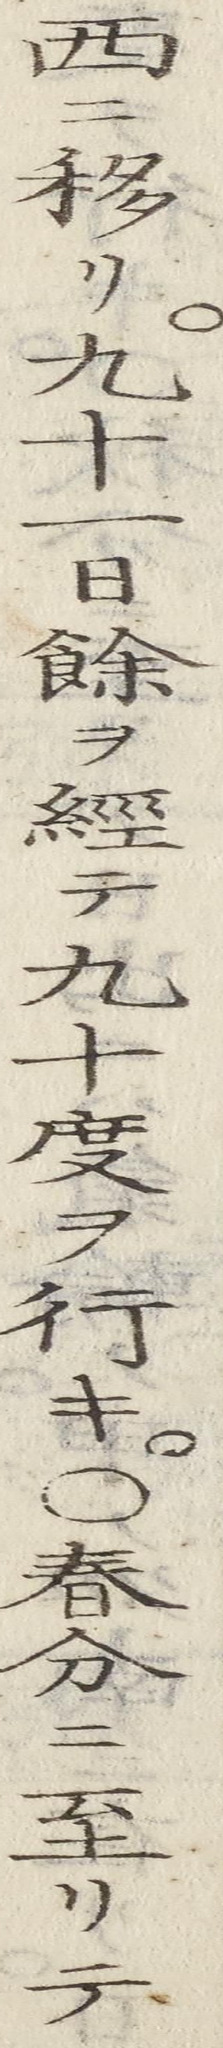西ニ移リ。九十一日余ヲ経テ九十度ヲ行キ。〇春分ニ至リテ
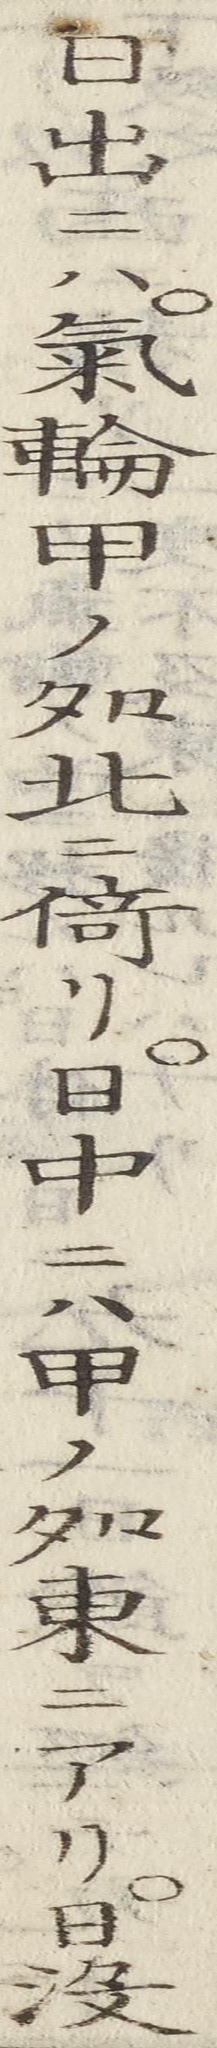日出ニハ。気輪甲ノ処北ニ倚リ。日中ニハ甲ノ処東ニアリ。日没
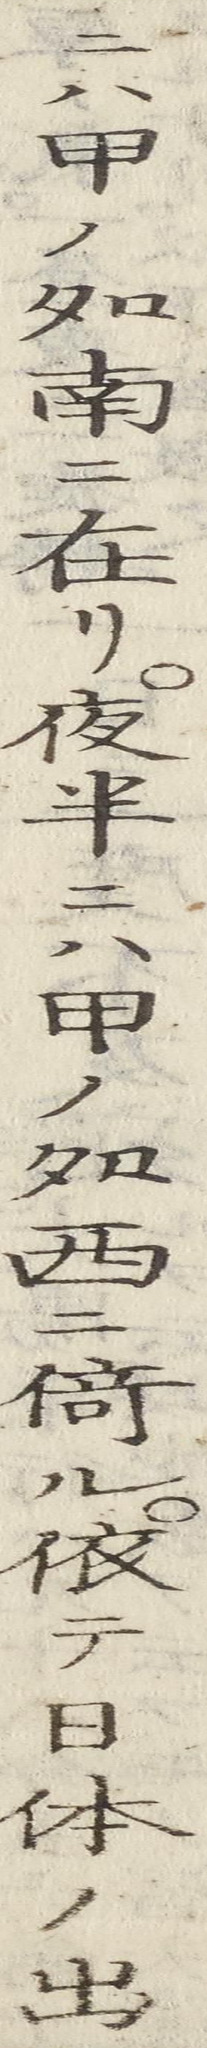ニハ甲ノ処南ニ在リ。夜半ニハ甲ノ処西ニ倚ル。依テ日体ノ出
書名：護法新論　二編　上
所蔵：東京大学地震研究所図書室 Earthquake Research Institute Library, The University of Tokyo, JAPAN
